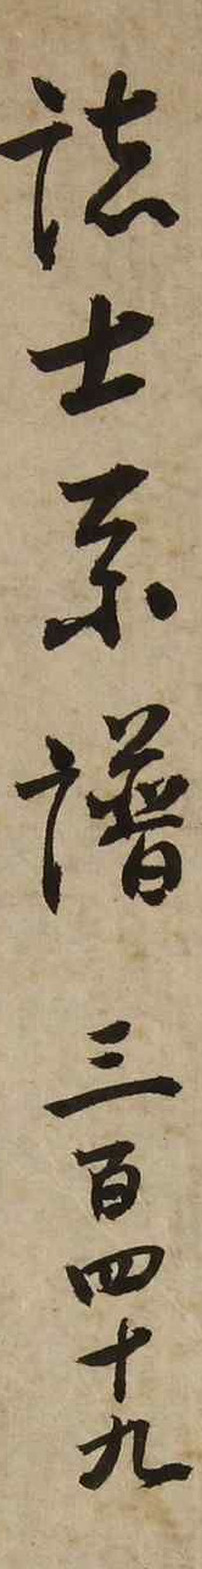諸士系譜三百四十九

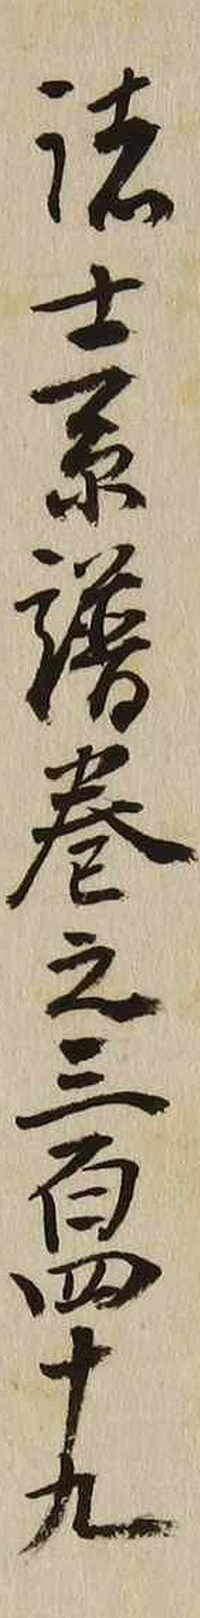諸士系譜巻之三百四十九
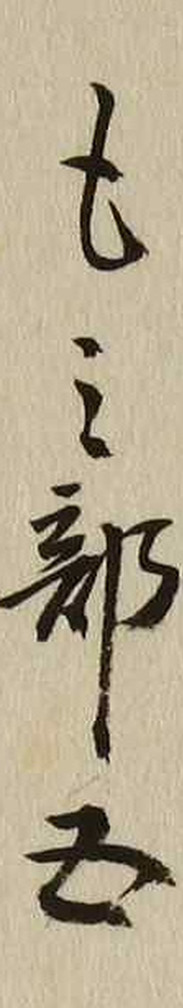も之部五
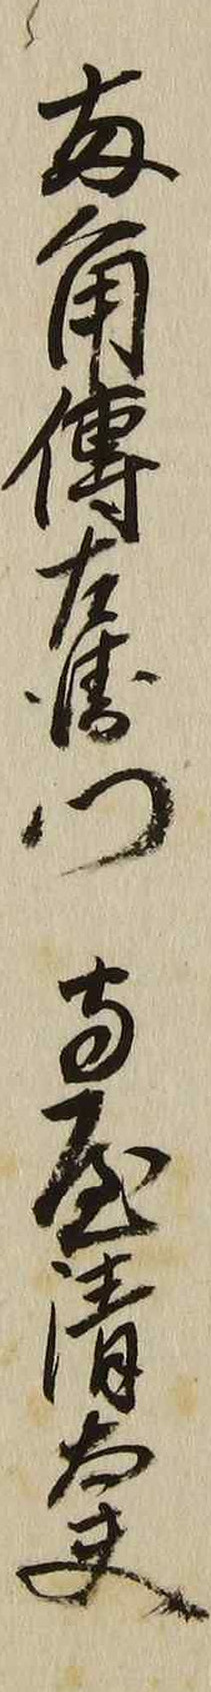両角伝左衛門守屋清太夫
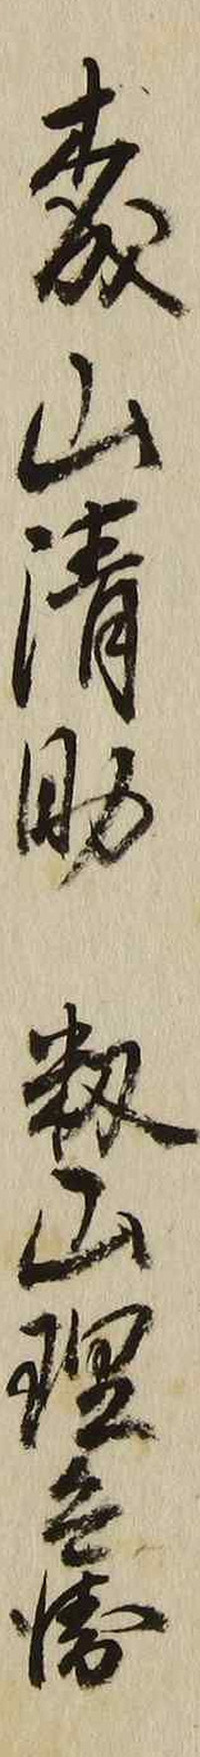森山清助籾山理兵衛

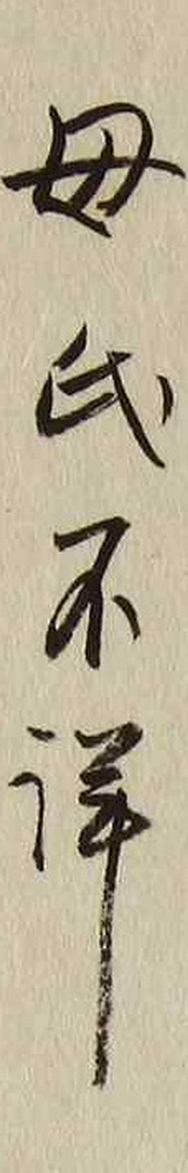母氏不詳
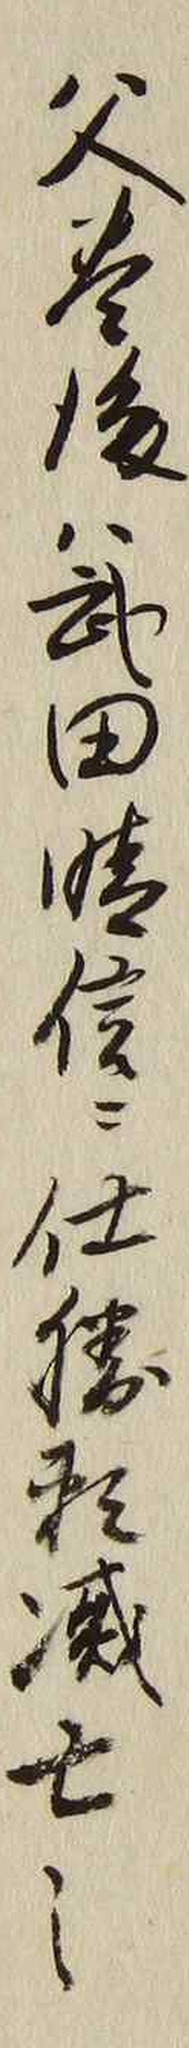父豊後ハ武田晴信ニ仕勝頼滅亡之
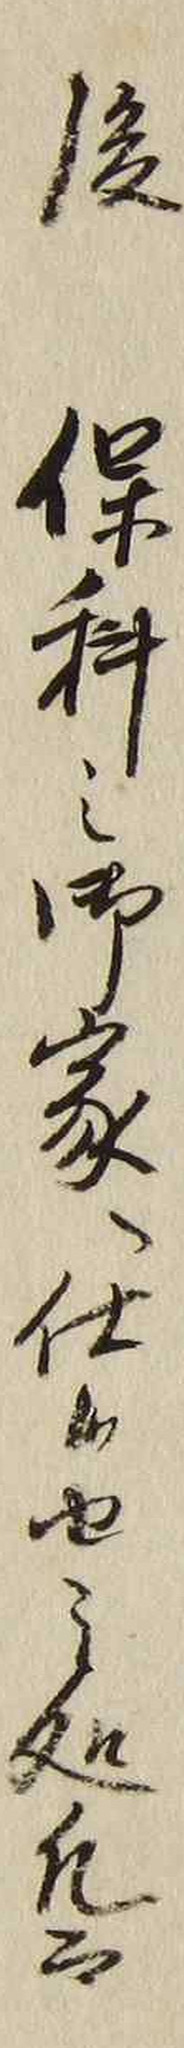後保科之御家へ仕候由之処凡而

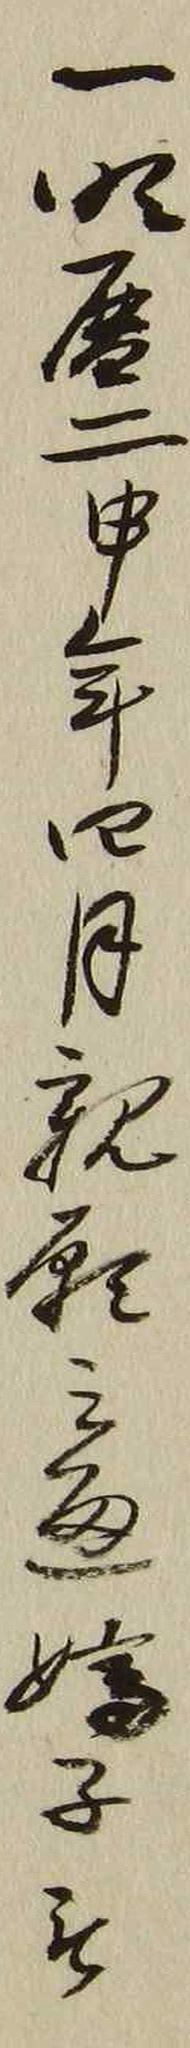一明暦二申年四月親願之通嫡子被
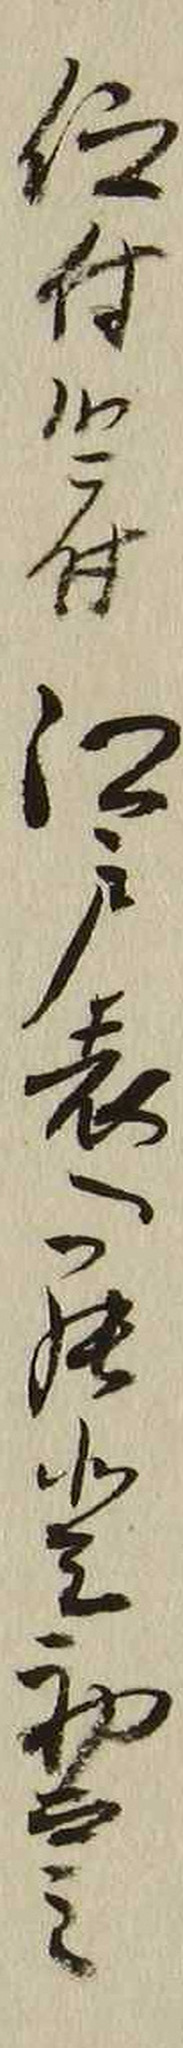仰付候ニ付江戸表へ罷登初而之
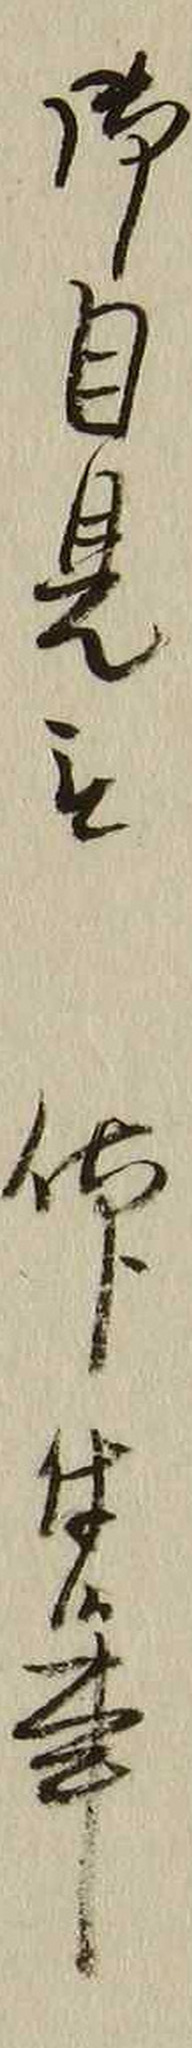御目見被仰付候事
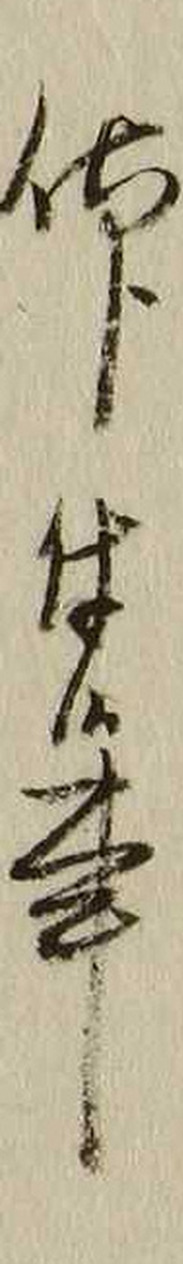被仰付候事
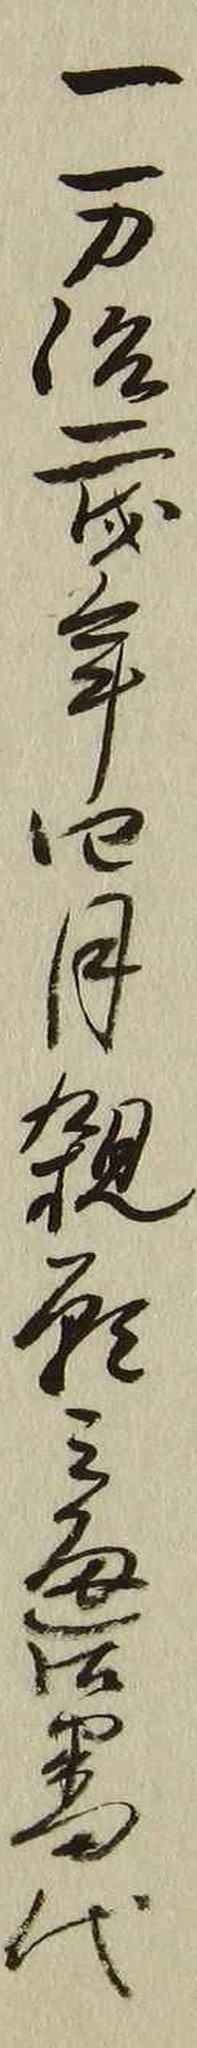一万治二戌年四月親願之通御番代
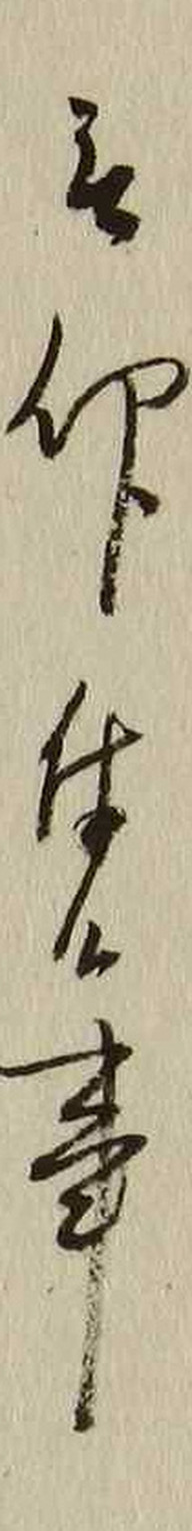被仰付候事
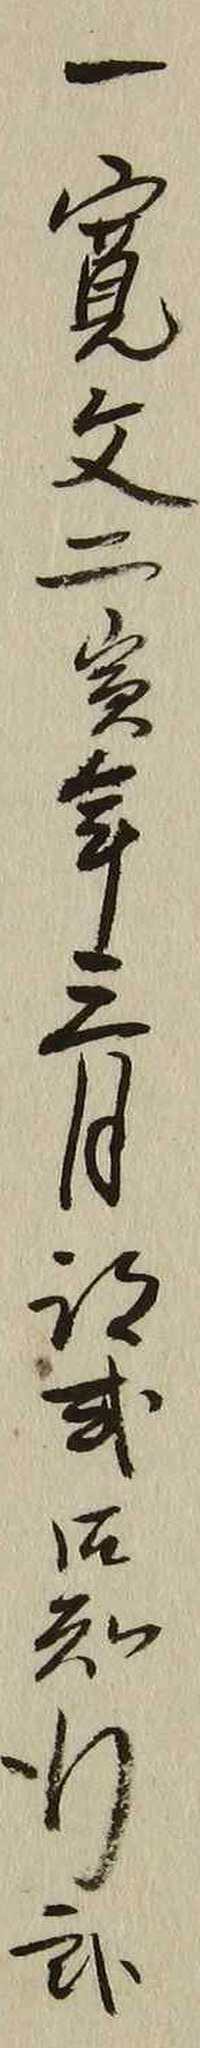一寛文二寅年三月跡式御知行弐
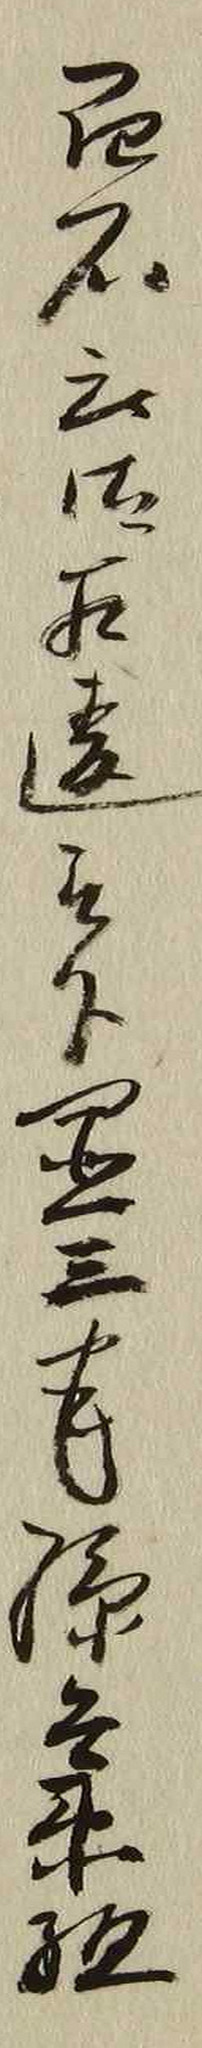百石無御相違被下置三宅孫兵衛組
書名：諸士系譜　巻之349　も之部5
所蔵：会津若松市立会津図書館
